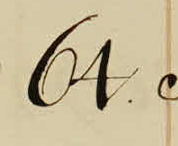64.
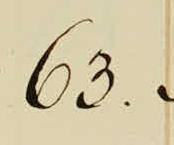63.
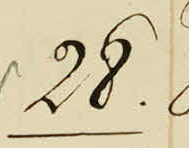28.
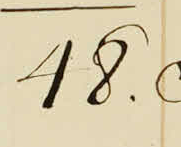48.
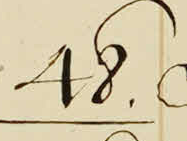48.
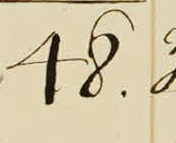48.
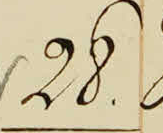28.
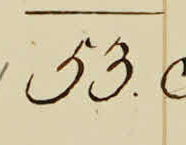53.
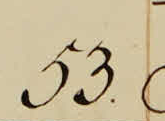53.
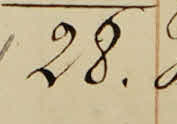28.
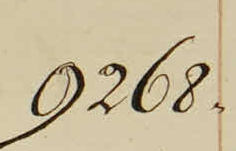9268
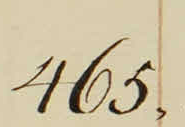465
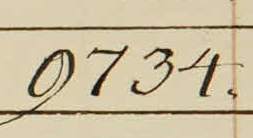9734
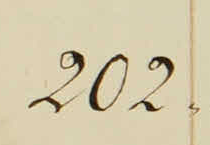202
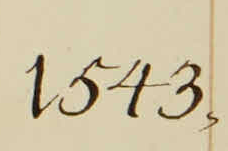1543
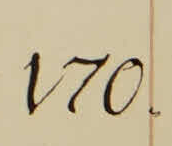170
